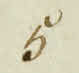5
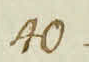40
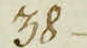38
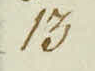13
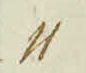11
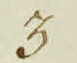3
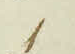1
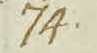74
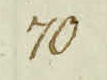70
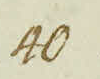40
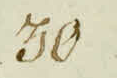30
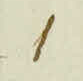1
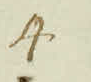4
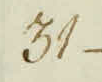31
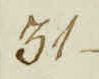31
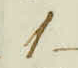1
